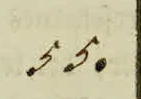55.
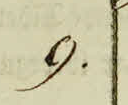9.
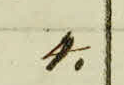4.
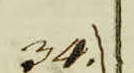34.
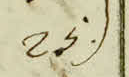25.
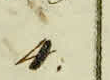4.
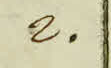2.
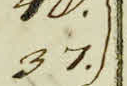37.
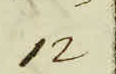12
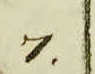7.
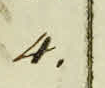4.
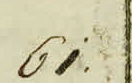61.
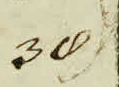38
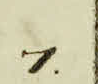7.
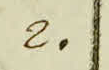2.
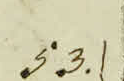53.
